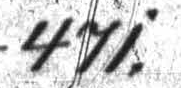471.
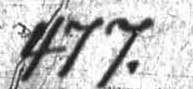477.
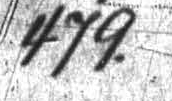479.
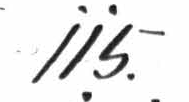115.
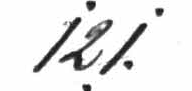121.
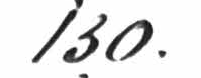130.
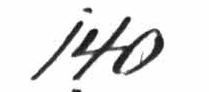140.
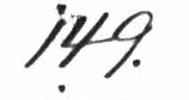149.
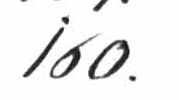160.
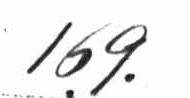169.
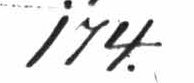174.
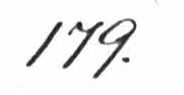179.
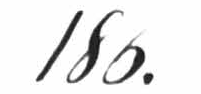186.
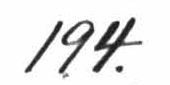194.
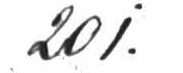201.
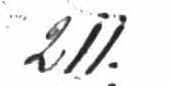211.
